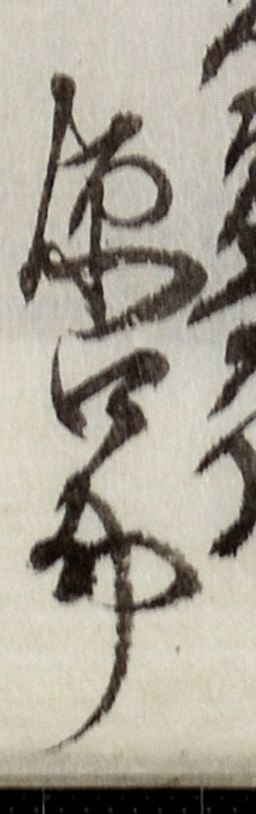源四郎
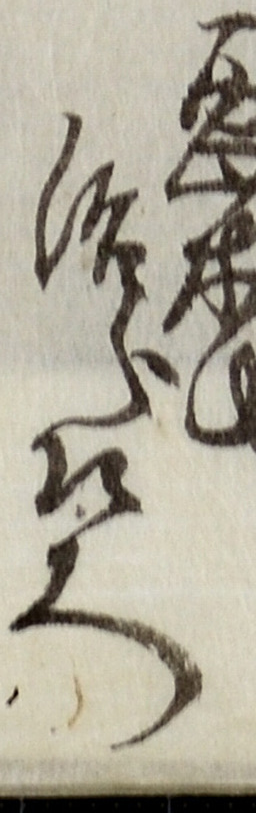治郎左衛門
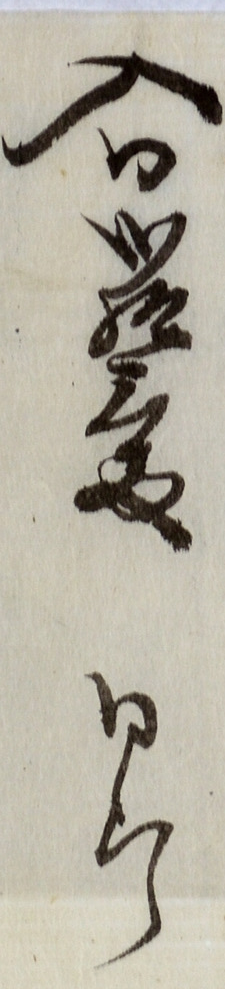入同弐拾両同断
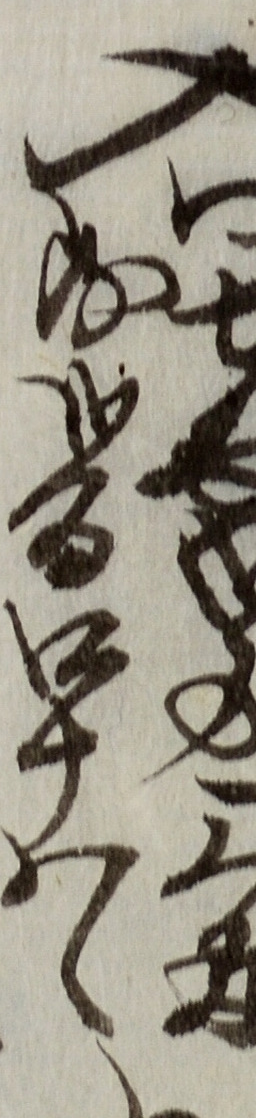残弐百四十八文

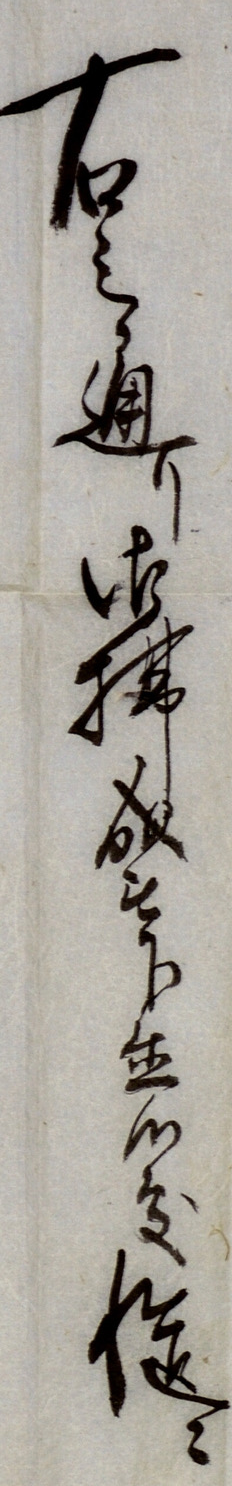右之通り御払成被下置候処慥ニ
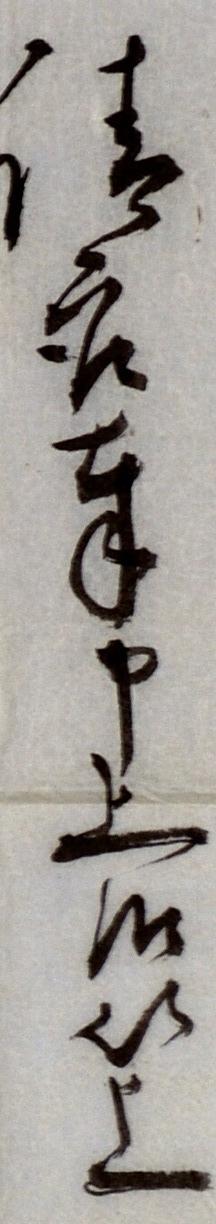請取奉申上候以上
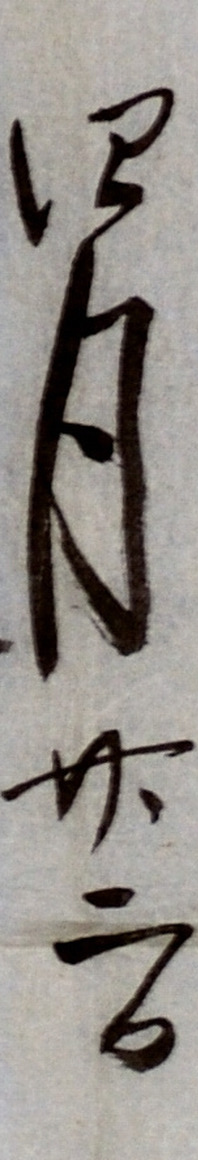四月廿二日
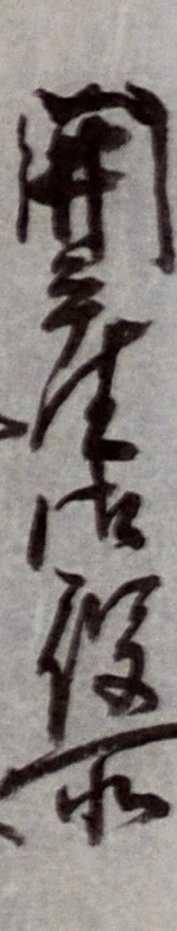開産御役所
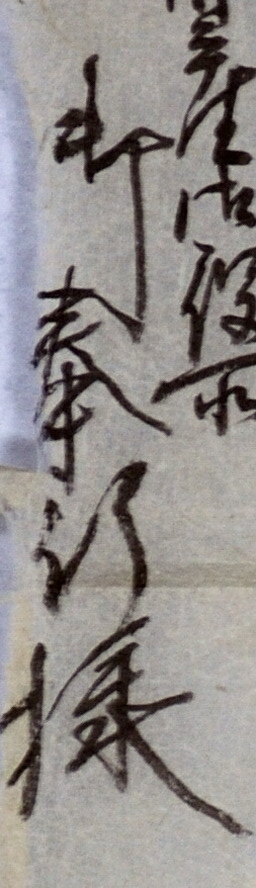御奉行様

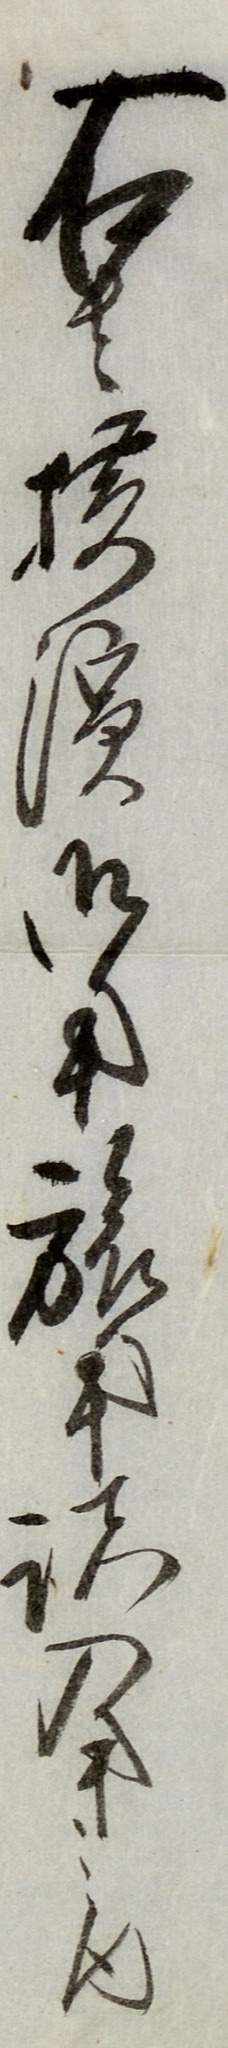右は横浜御用旅用諸入用之内
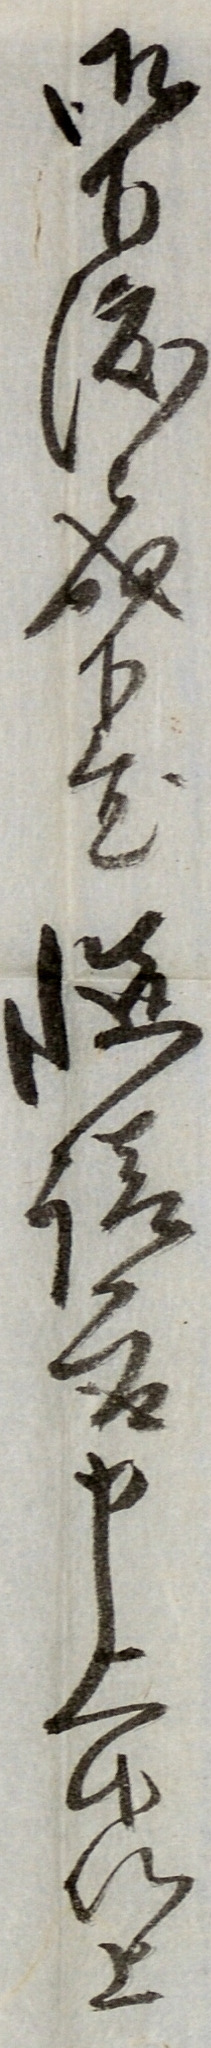御下渡被成下置慥請取申上候以上
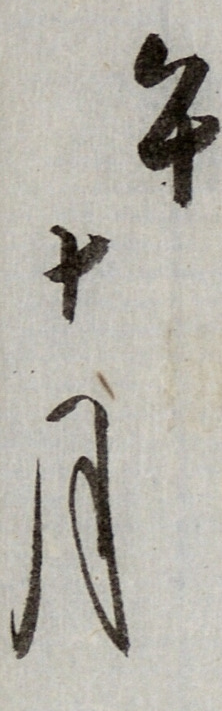午十月
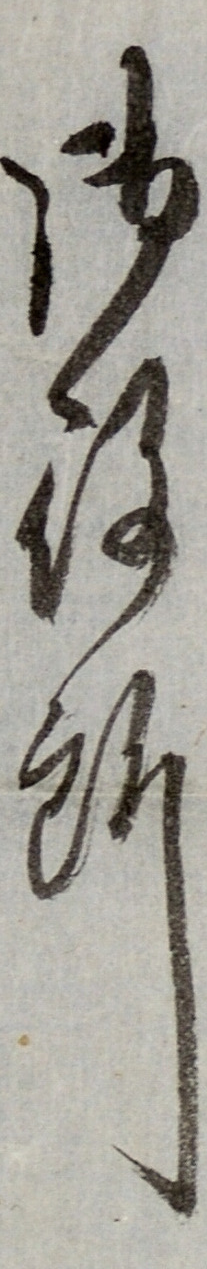御役所

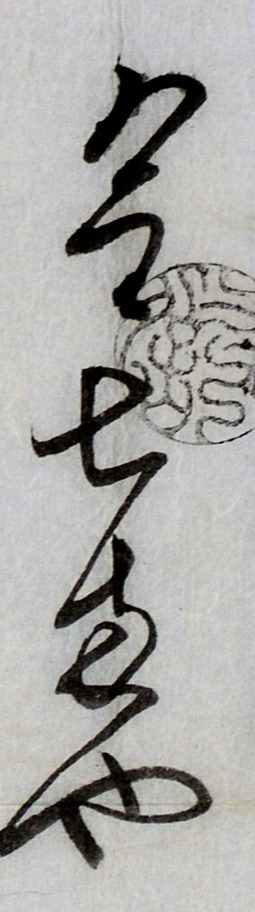金七両也
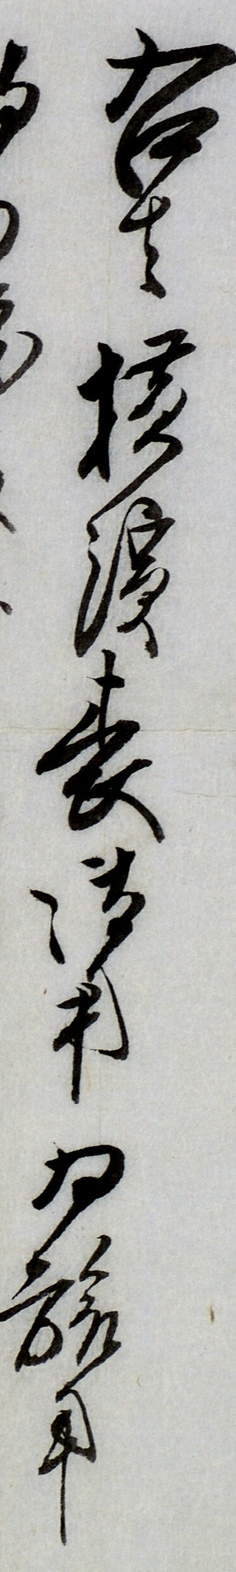右は横浜表御用為旅用
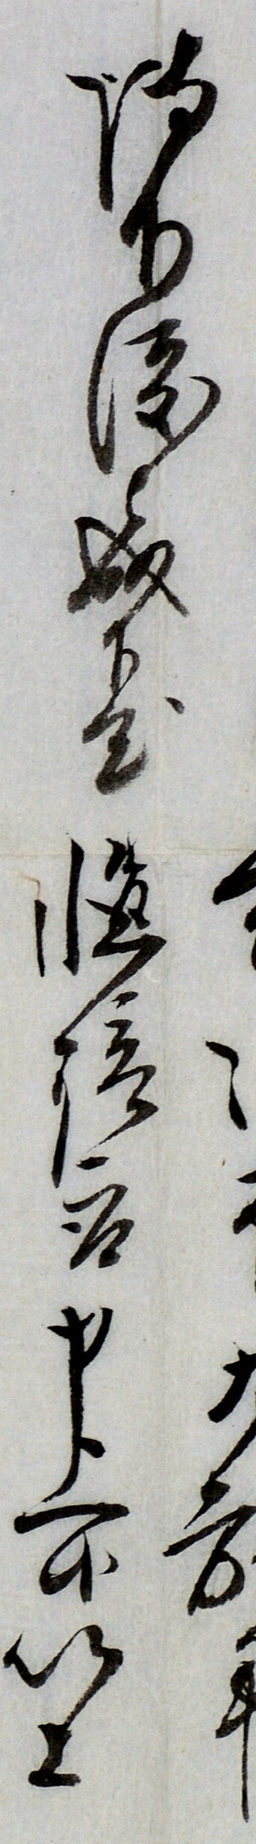御下渡被成置慥請取申上候以上
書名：御山方御拂物代料取立帳
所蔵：伊那市立高遠町図書館・合同会社AMANE
